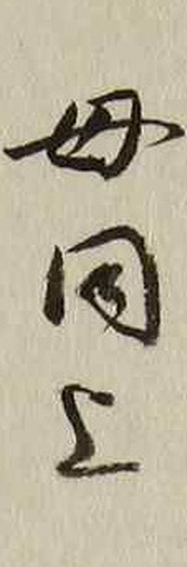母同上
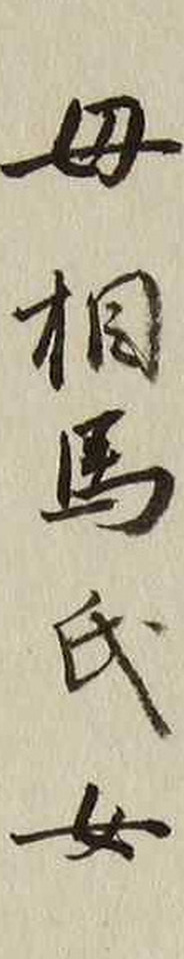母相馬氏女
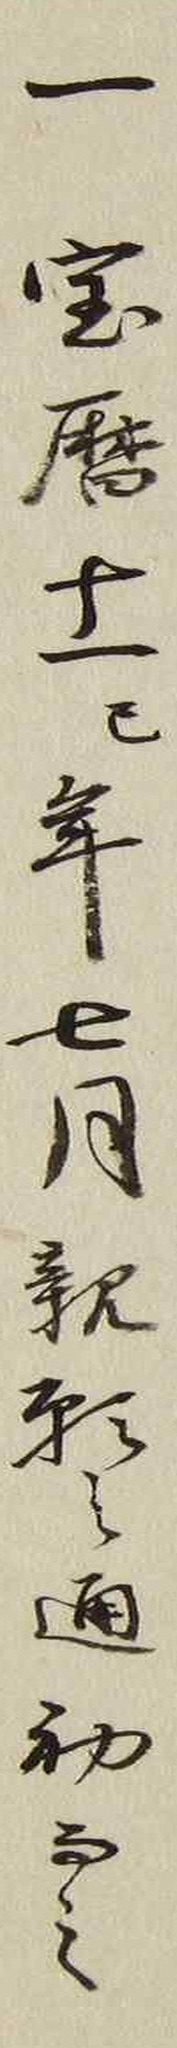一宝暦十一巳年七月親願之通初而之
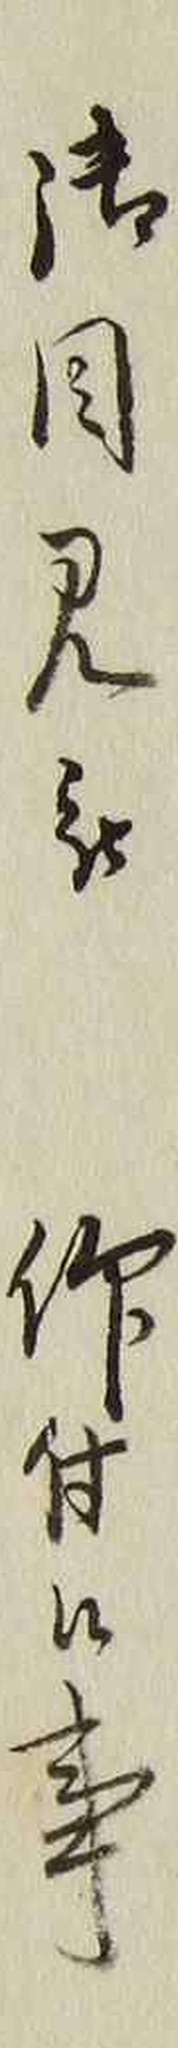御目見被仰付候事
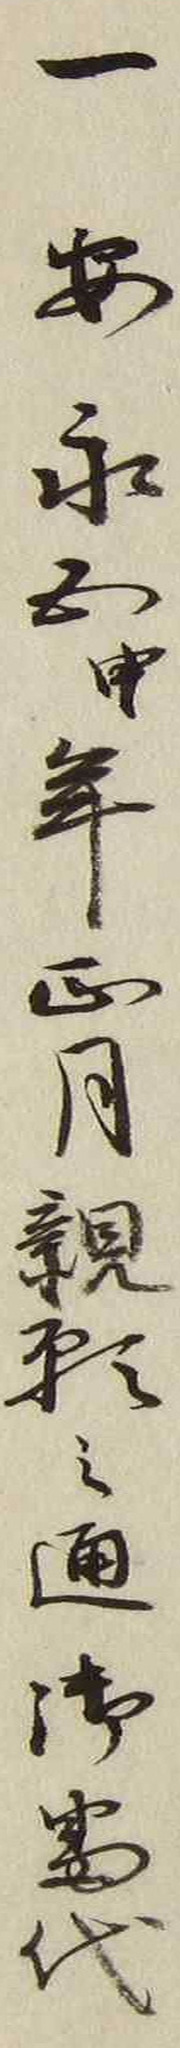一案永五申年正月親願之通御番代

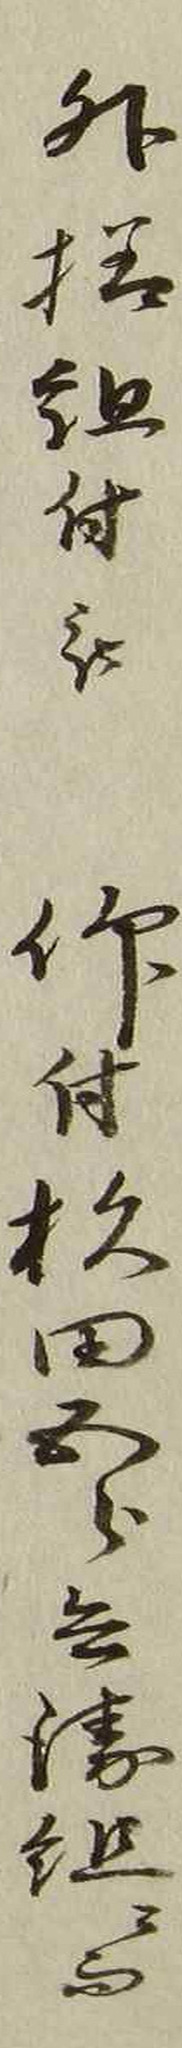外様組付被仰付杉田五郎兵衛組ニ而
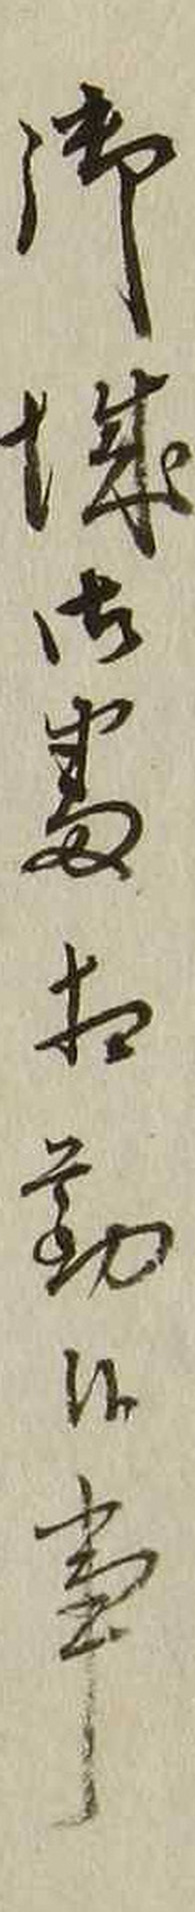御城御番相勤候事
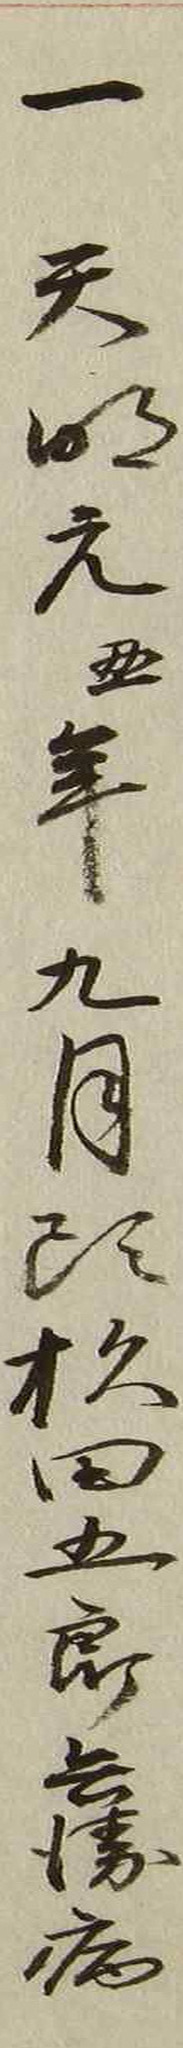一天明元丑年九月頭杉田五郎兵衛病
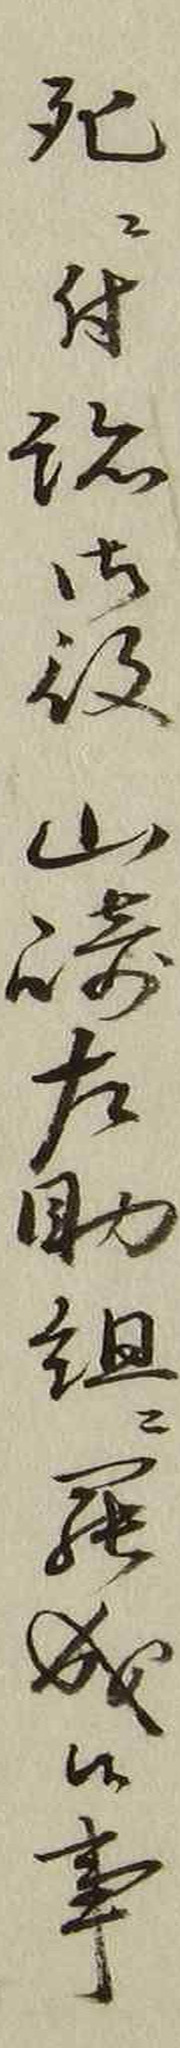死ニ付跡御役山崎左助組ニ罷成候事
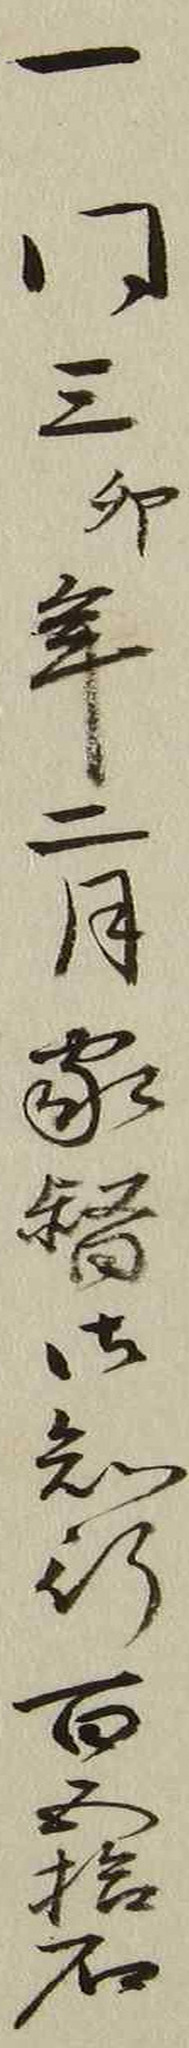一同三卯年二月家督御知行百五拾石
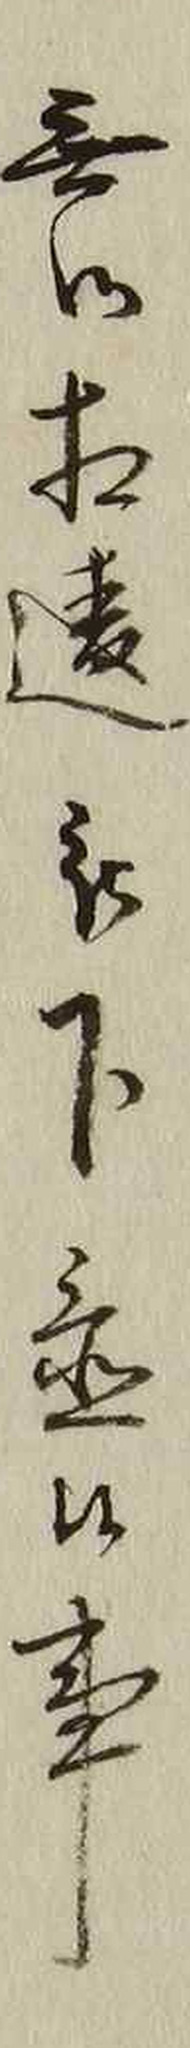無御相違被下置候事
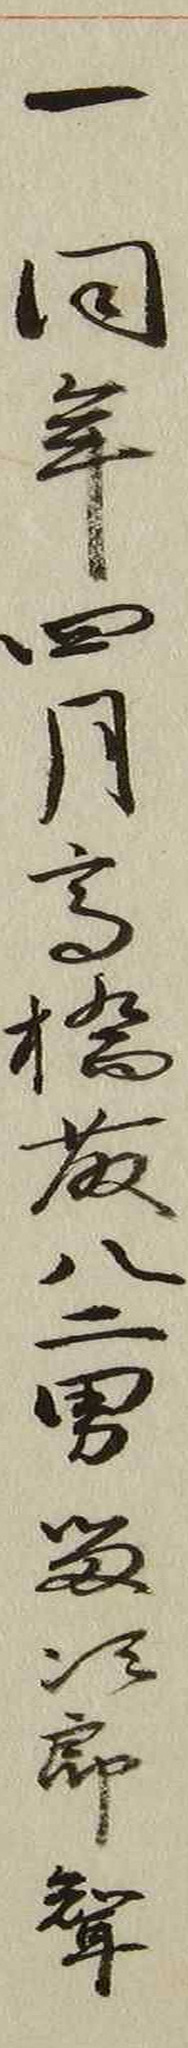一同年四月高橋藤八二男留次郎婿
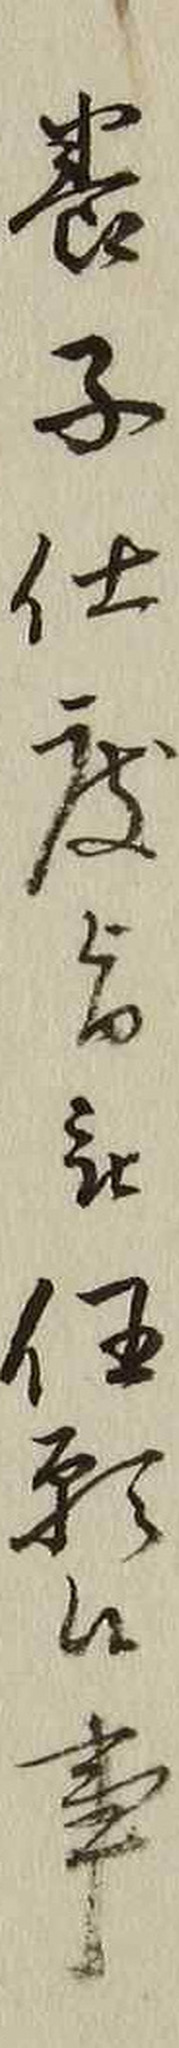養子仕度旨被任願候事
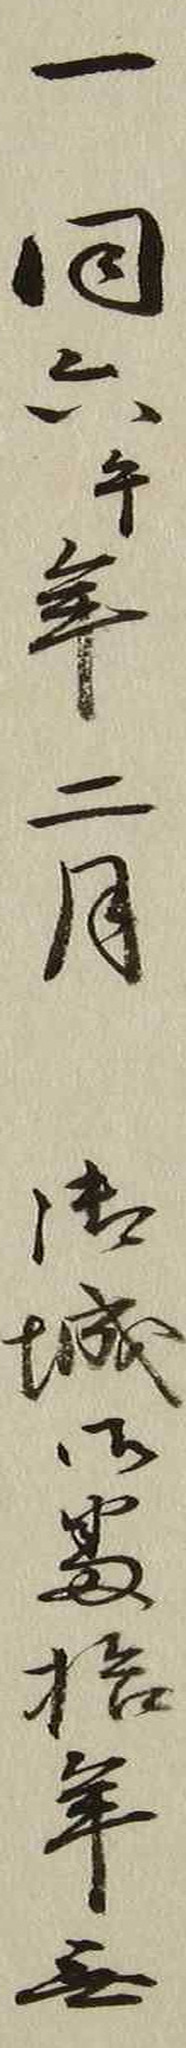一同六午年二月御城御番拾年無
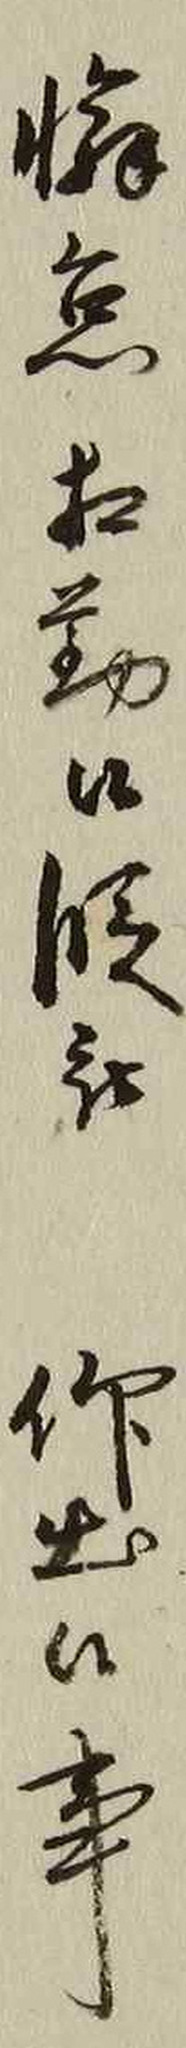懈怠相勤候段被仰出候事
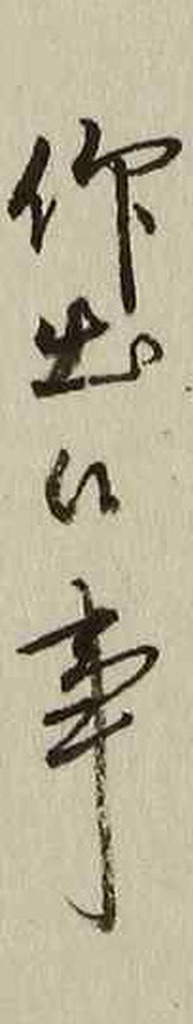仰出候事
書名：諸士系譜　巻之149　そ之部2
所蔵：会津若松市立会津図書館
